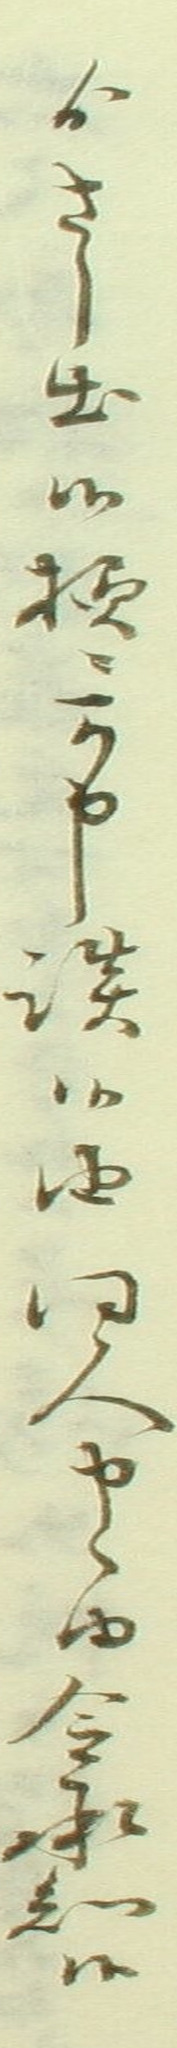ゟさし出候様に可申談候由同人申候由令承知候
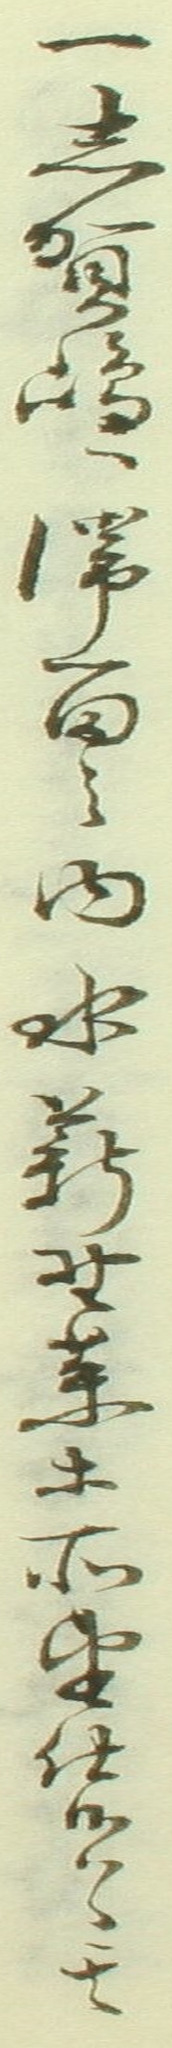一志賀島へ滞留之内水薪野菜等所望仕候はゝ其
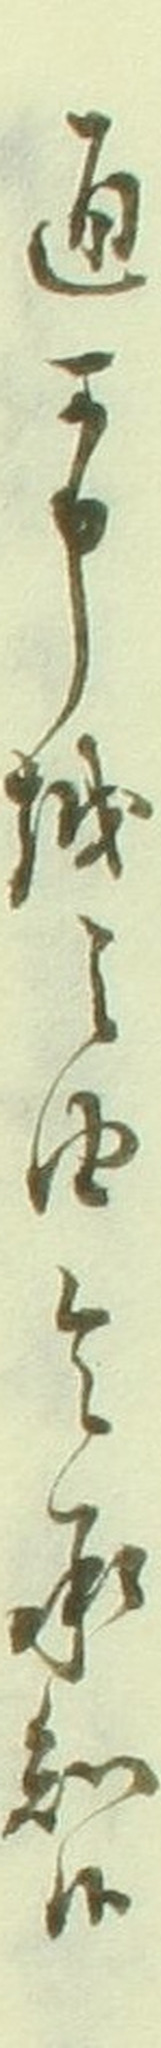通可申越之由令承知候
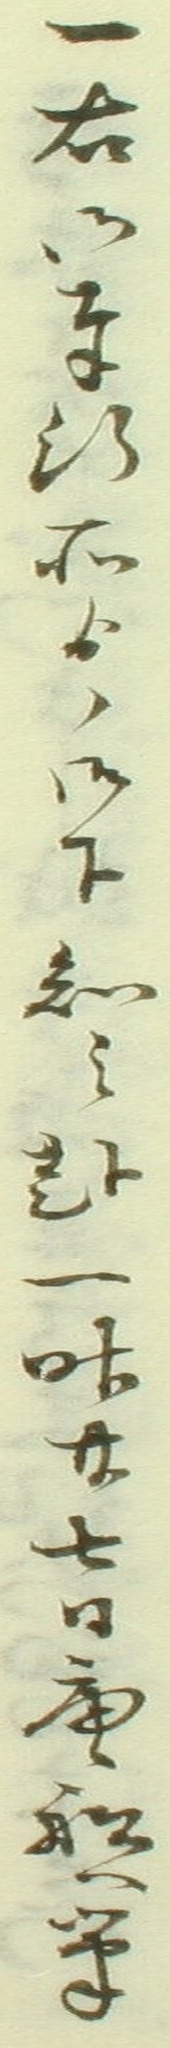一右御奉行所ゟ之御下知之赴一昨廿七日唐船へ筆
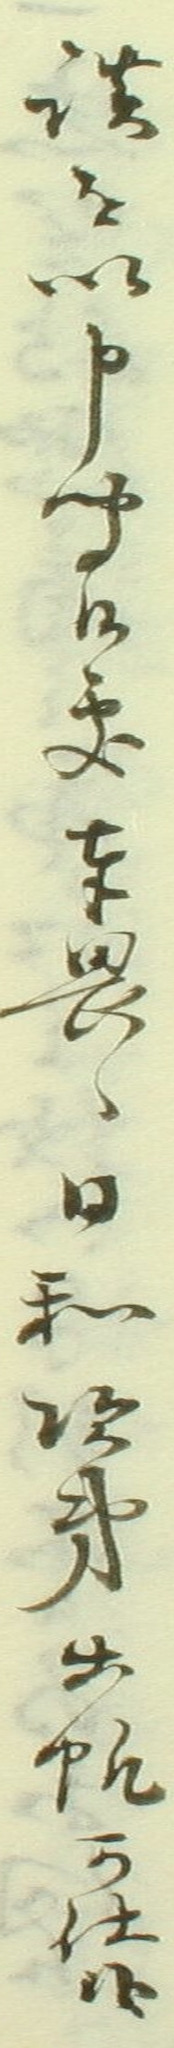談を以申聞候処奉畏候日和次第出帆可仕候
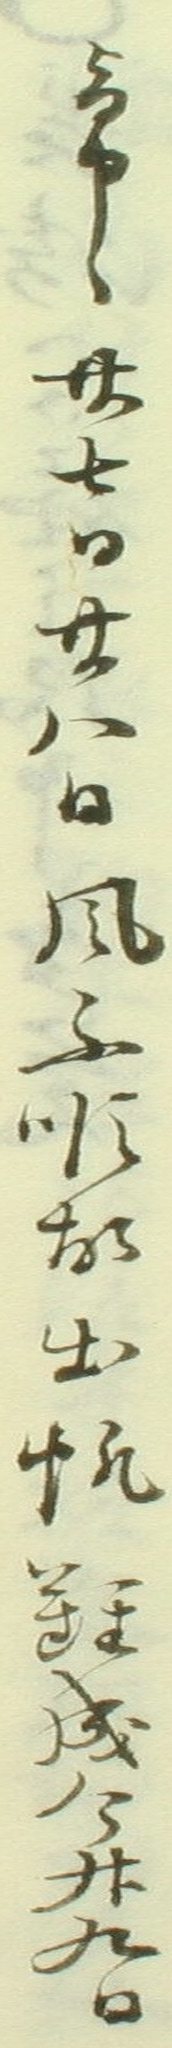旨申候廿七日廿八日風不順故出帆難成今廿九日
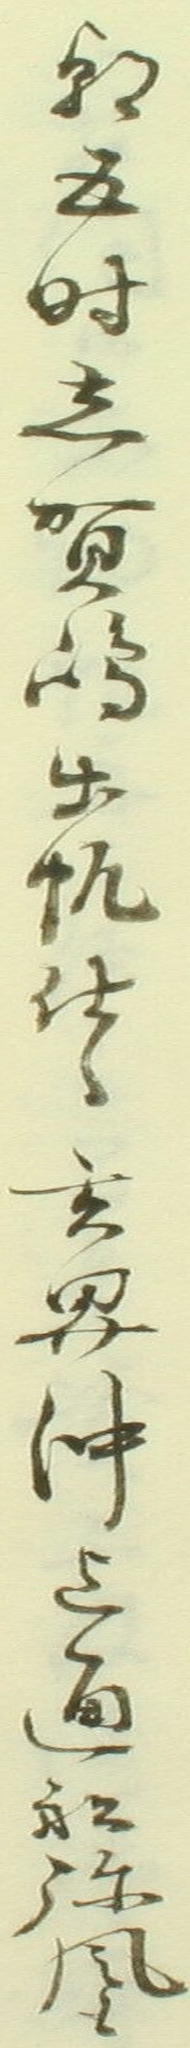朝五時志賀島出帆仕候玄界沖迄通船弥風も
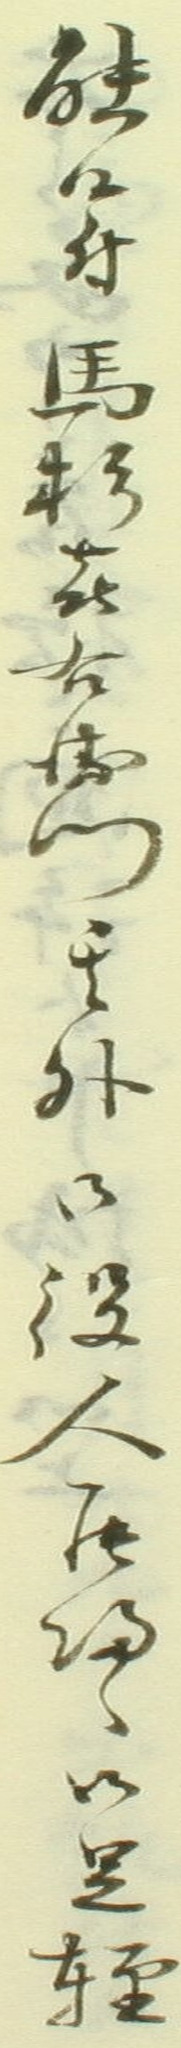能候付馬杉来喜右衛門其外御役人罷帰候御足軽
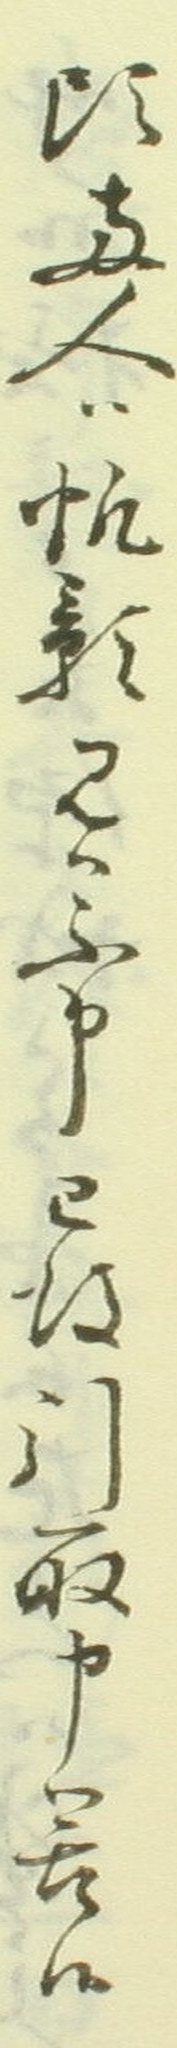頭両人は帆影見へ不申已後引取申筈候
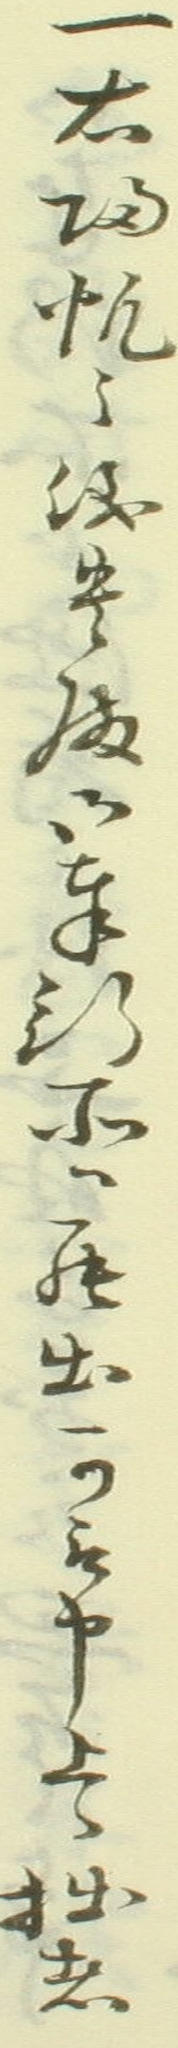一右帰帆之儀貴殿御奉行所へ罷出可被申上候拙者
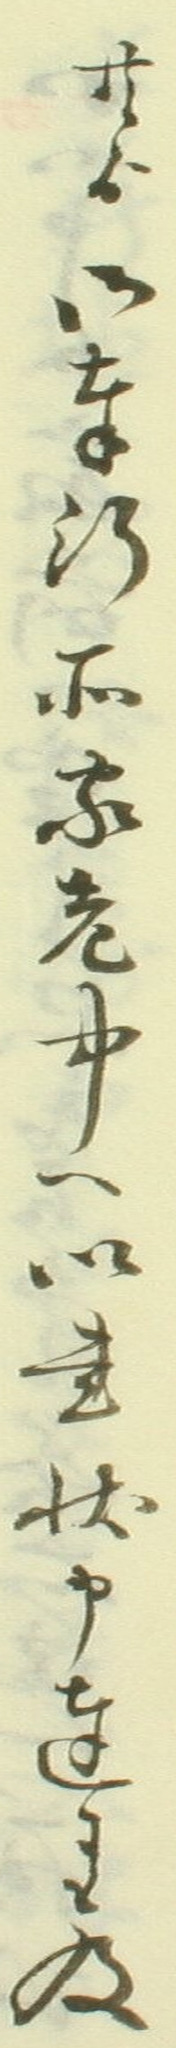共ゟ御奉行所家老中へ御書状申達にも及
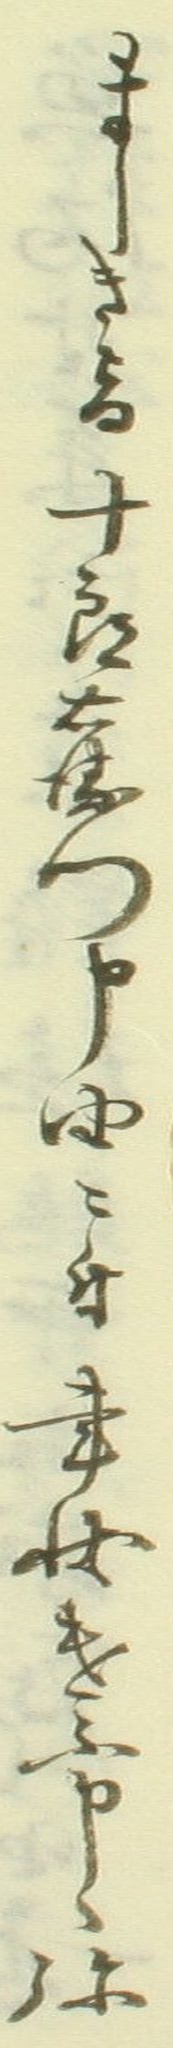ましき旨十郎右衛門申由に付書状遣不申候弥
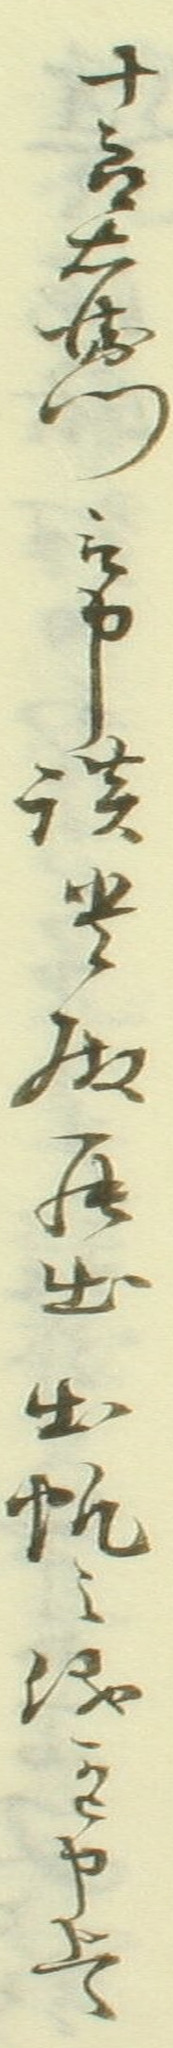十郎右衛門被申談貴殿罷出出帆之儀可被申上候
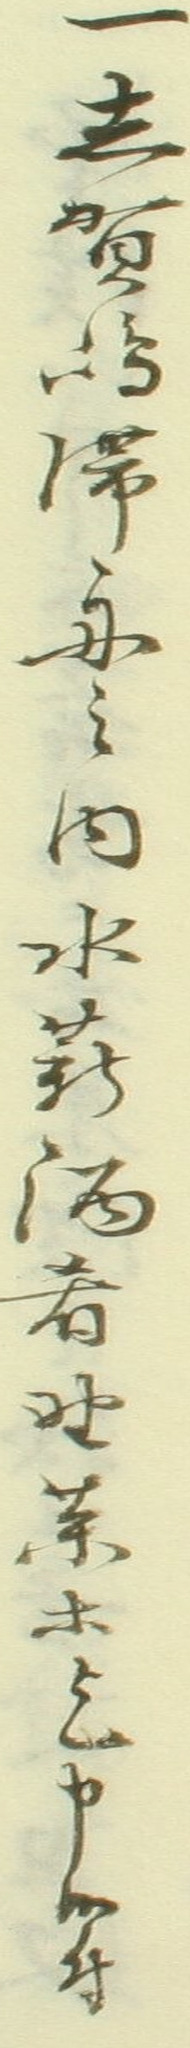一志賀島滞舟之内水薪酒肴野菜等乞申候付
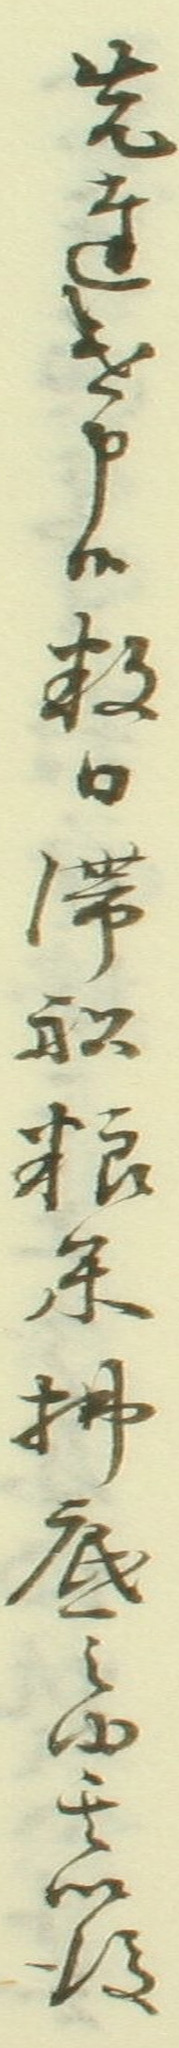先達遣申候数日滞船粮米払底之由其以後
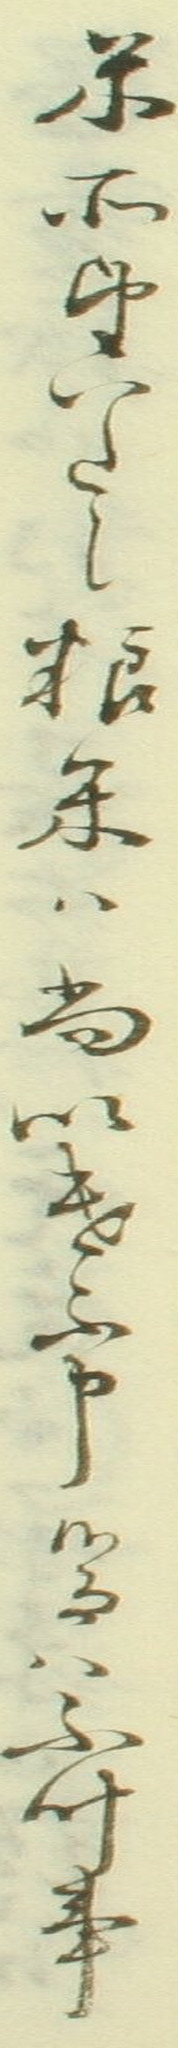米所望いたし粮米は尚以遣不申候而は不叶事
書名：異国船漂着記
